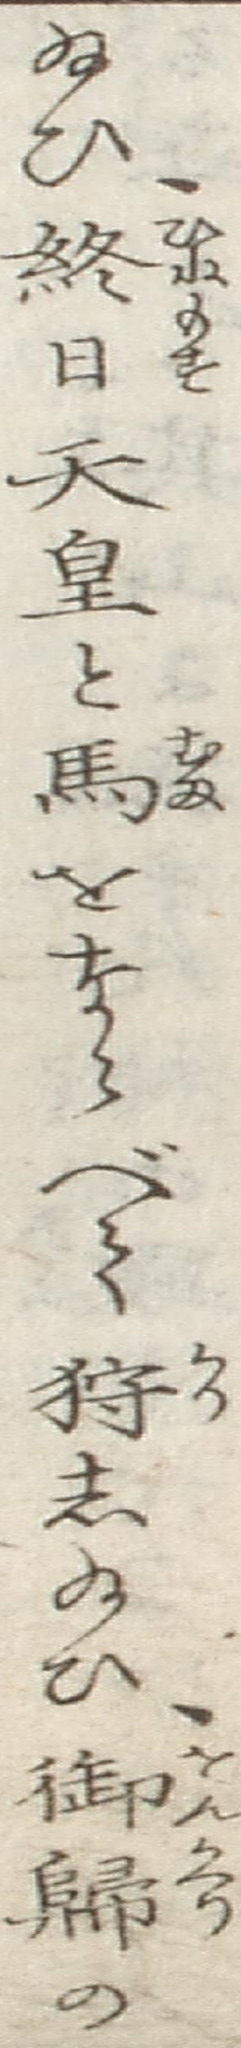給ひ、終日天皇と馬をならべて狩し給ひ、御帰の
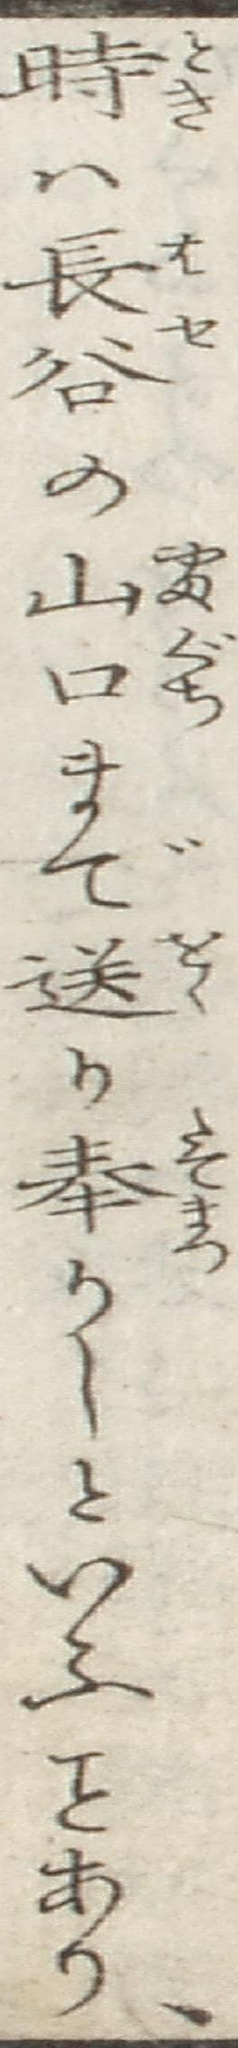時は長谷の山口まで送り奉りしといふことあり、
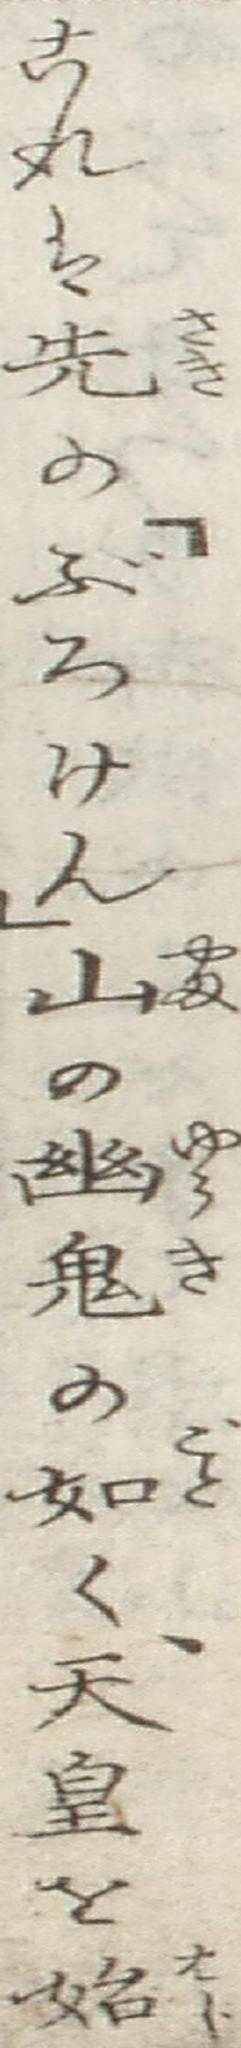これは先の「ぶろけん」山の幽鬼の如く、天皇を始

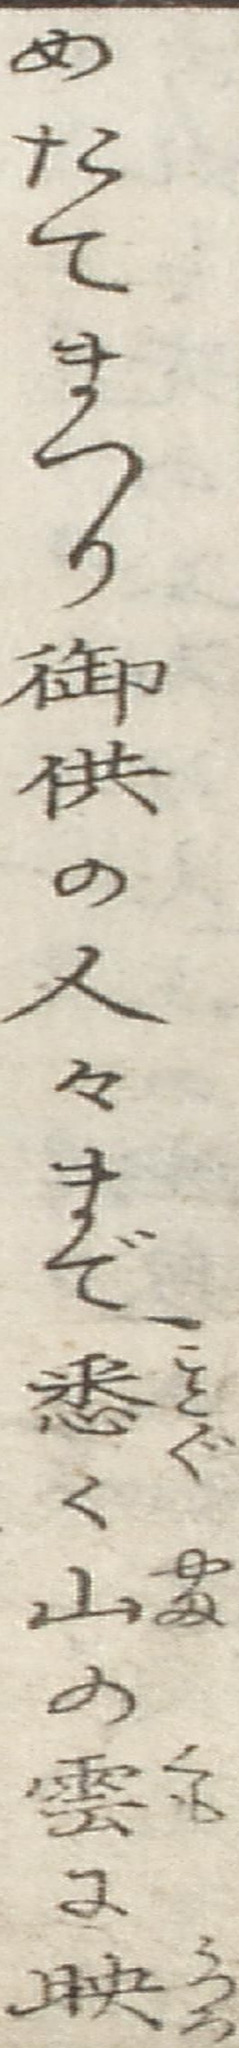めたてまつり御供の人々まで、悉く山の雲に映
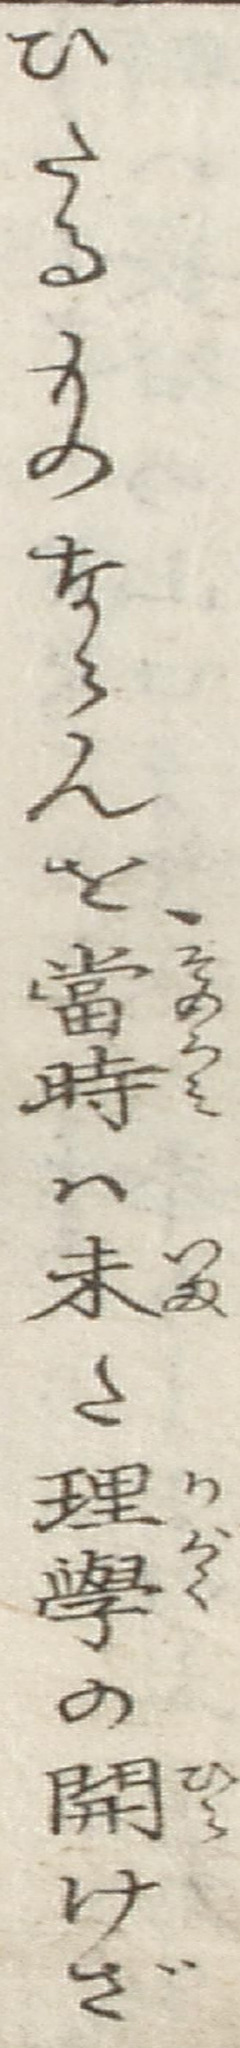ひたるものならんを、当時は未た理学の開けざ
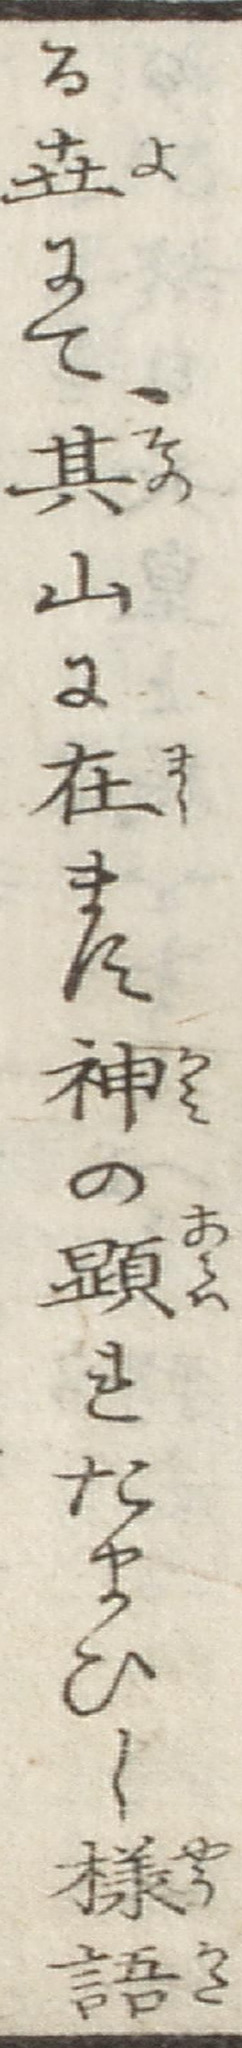る世にて、其山に在ます神の顕れたまひし様語
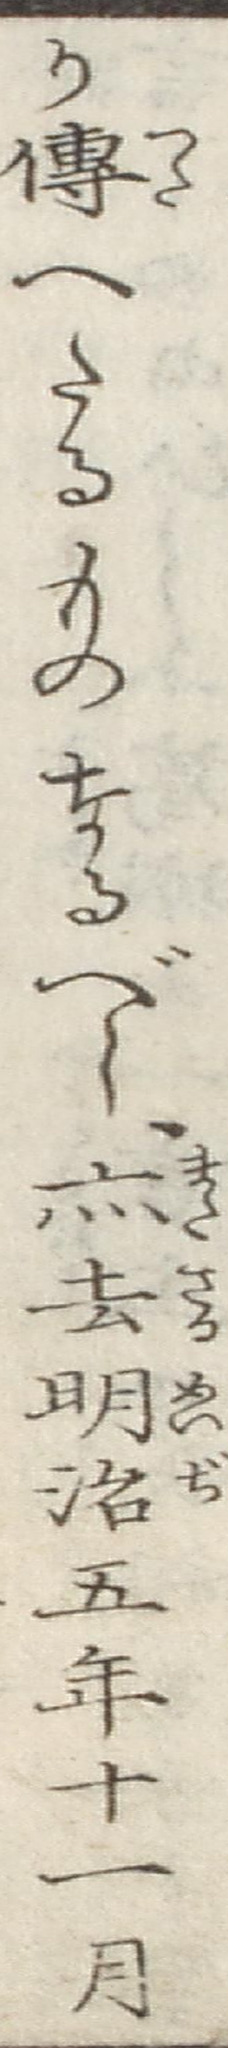り伝へたるものなるべし、亦去明治五年十一月
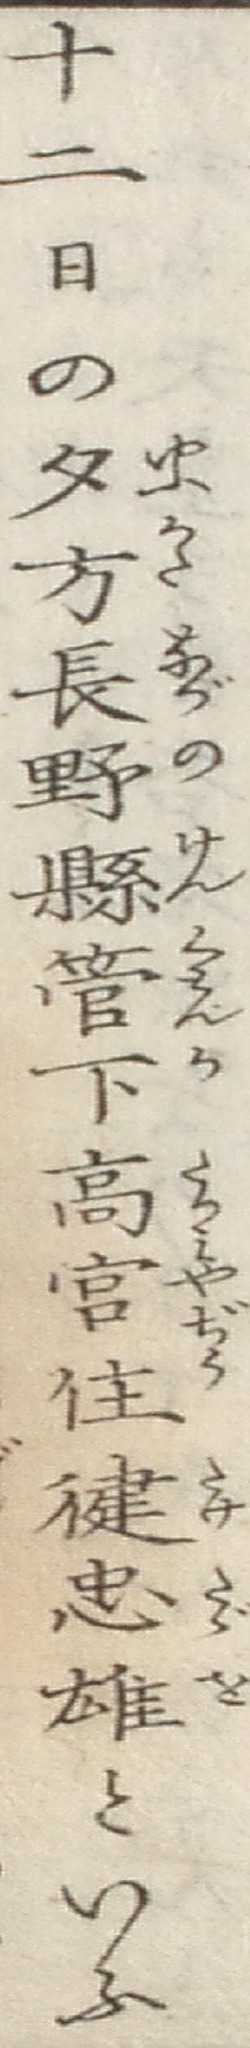十二日の夕方長野県管下高宮住健忠雄といふ
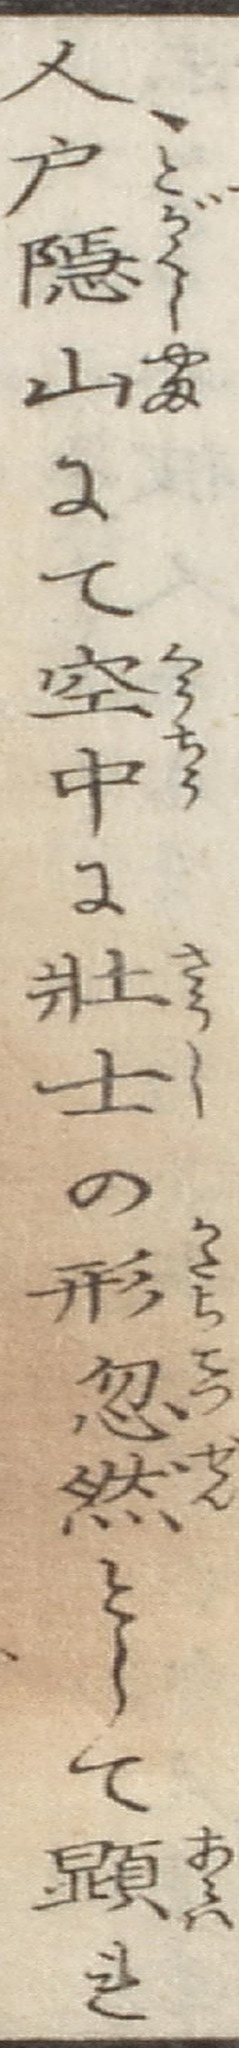人、戸隠山にて空中に壮士の形忽然として顕れ
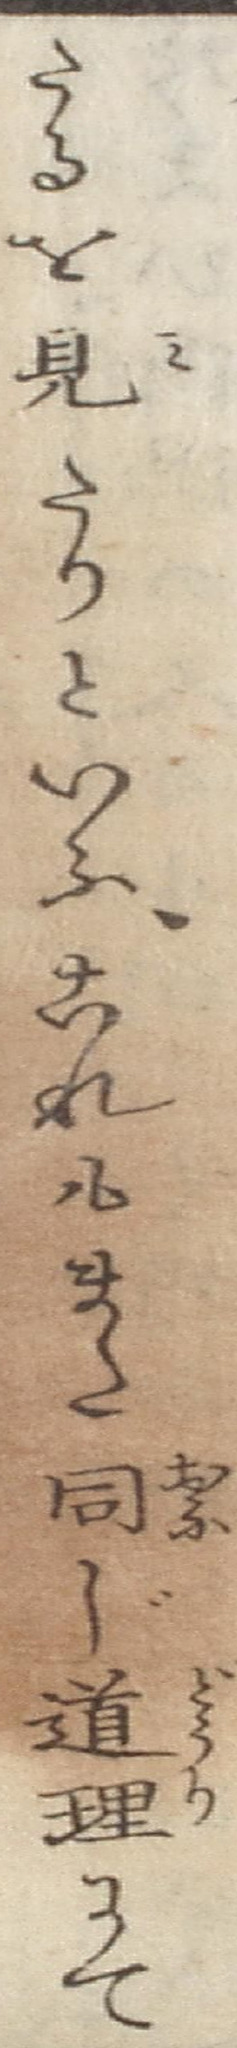たるを見たりといふ、これもまた同じ道理にて
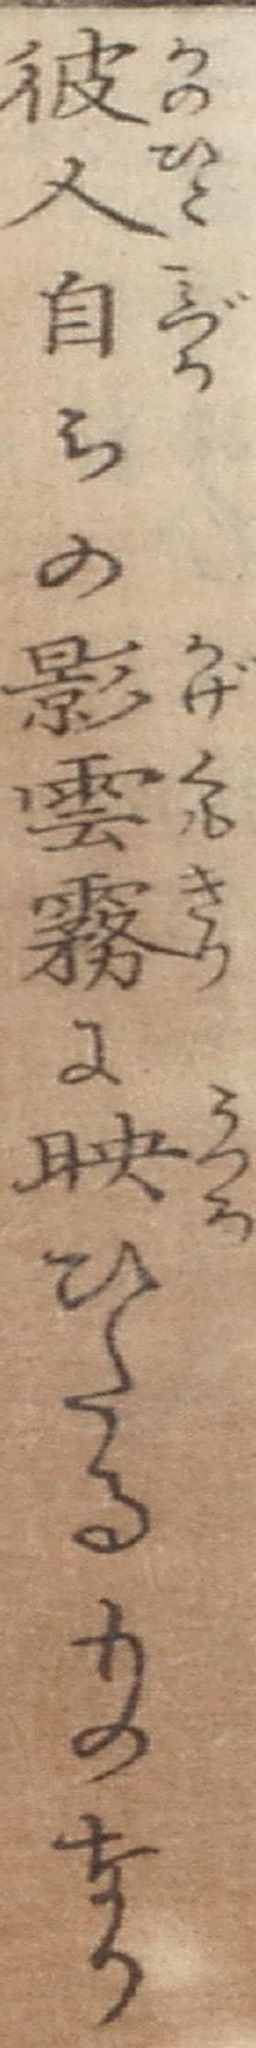彼人自らの影雲霧に映ひたるものなり
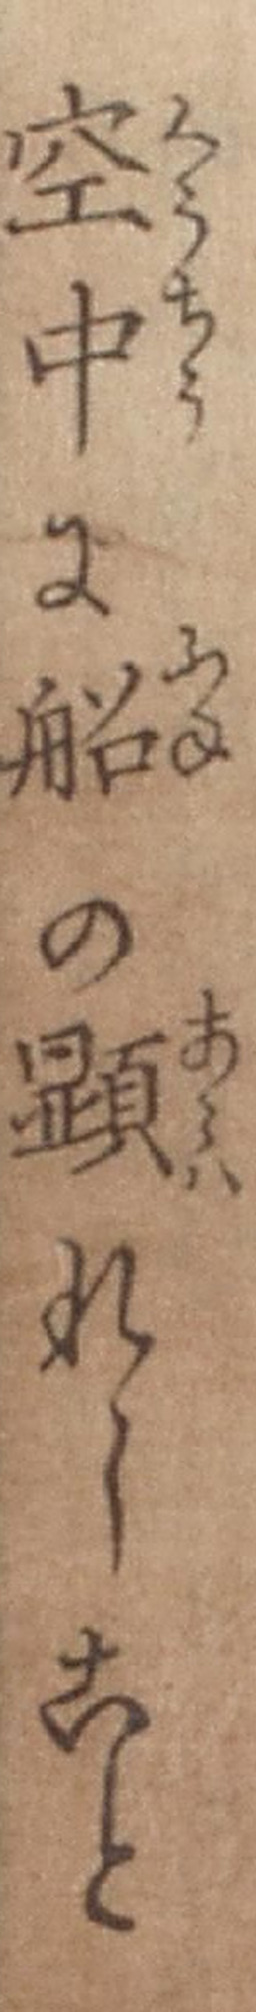空中に船の顕れしこと
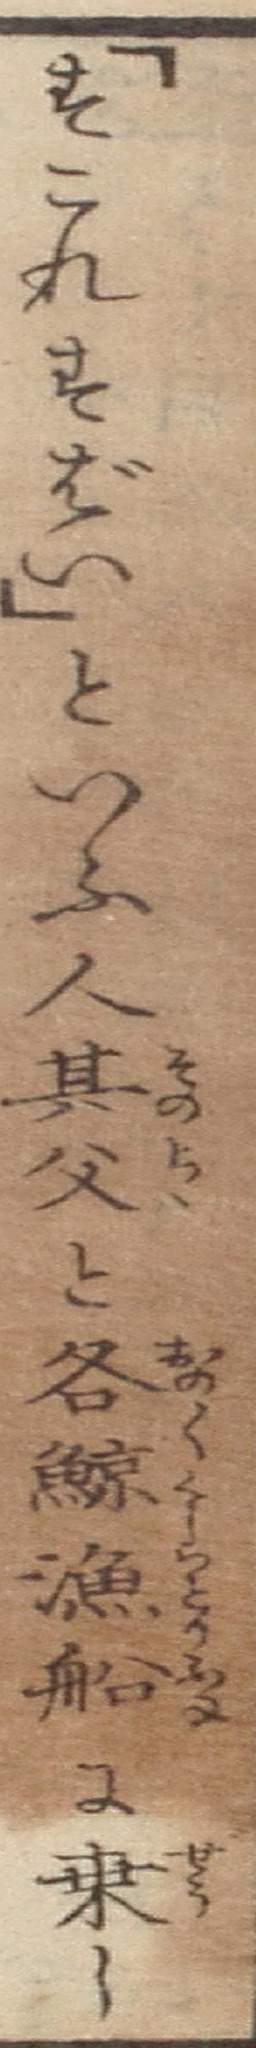「すこれすばい」といふ人其父と各鯨漁船に乗し
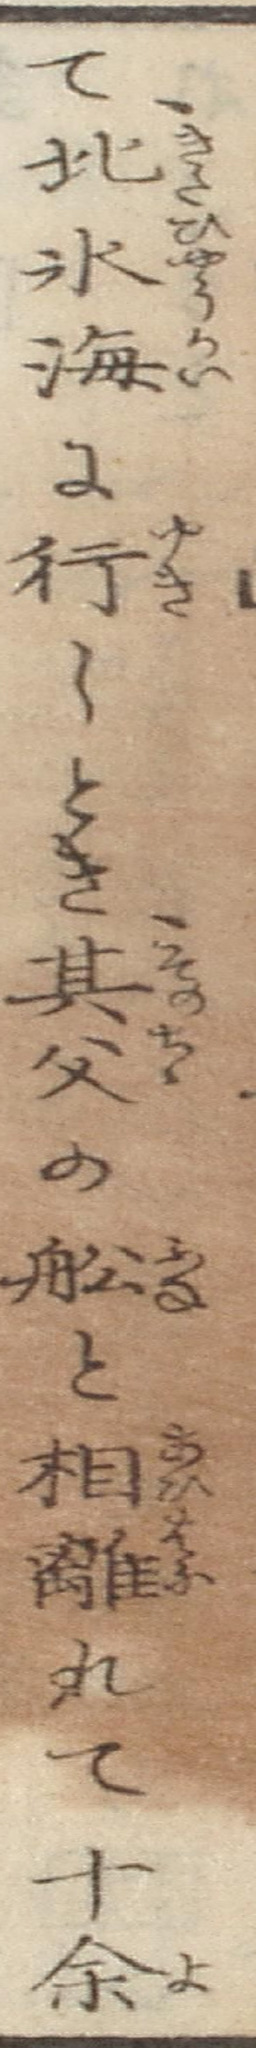て、北氷海に行しとき、其父の船と相離れて十余
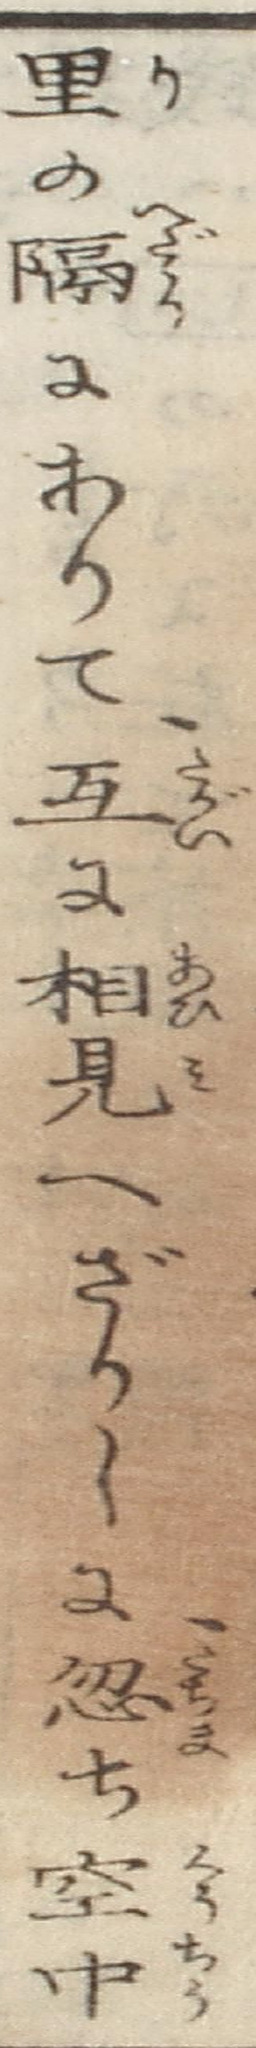里の隔にありて、互に相見へざりしに、忽ち空中
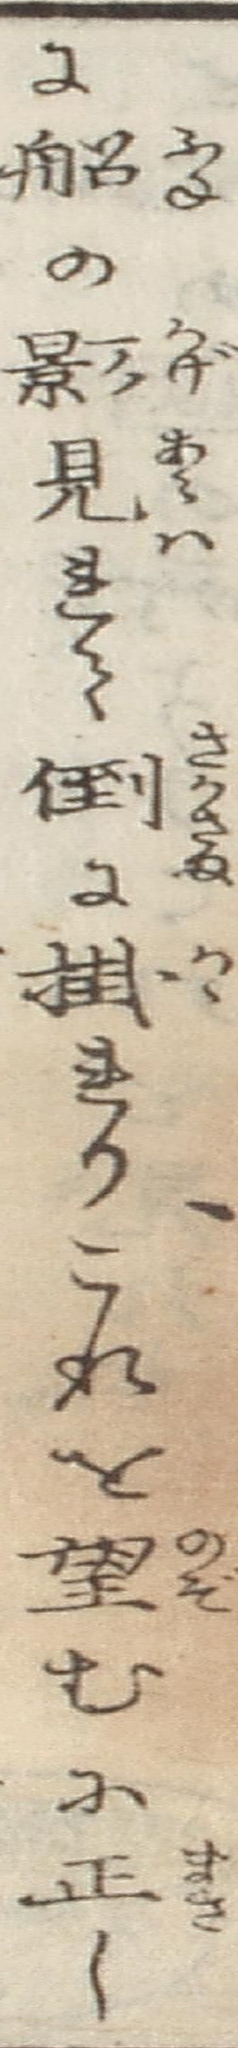に船の影見れて倒に掛れり、これを望むに正し
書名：変異辯　一名、天變地異拾遺　全
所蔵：東京大学地震研究所図書室 Earthquake Research Institute Library, The University of Tokyo, JAPAN
